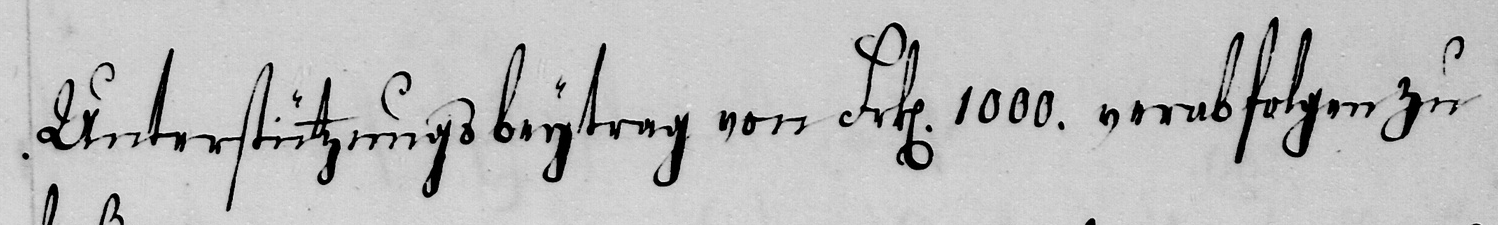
Unterstützungsbeytrag von Frk[en]. 1000. verabfolgen zu
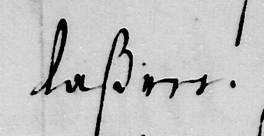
laßen.
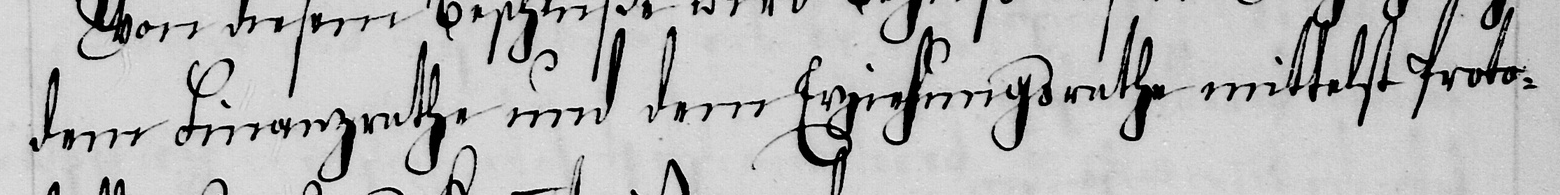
dem Finanzrathe und dem Erziehungsrathe mittelst Proto¬
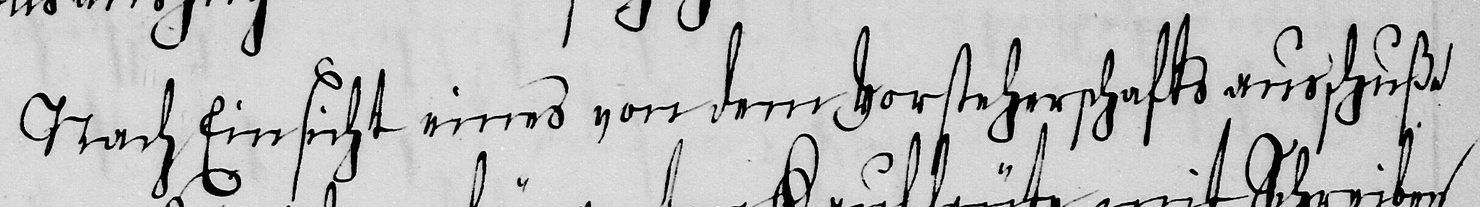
Nach Einsicht eines von dem Vorsteherschaftsausschuße
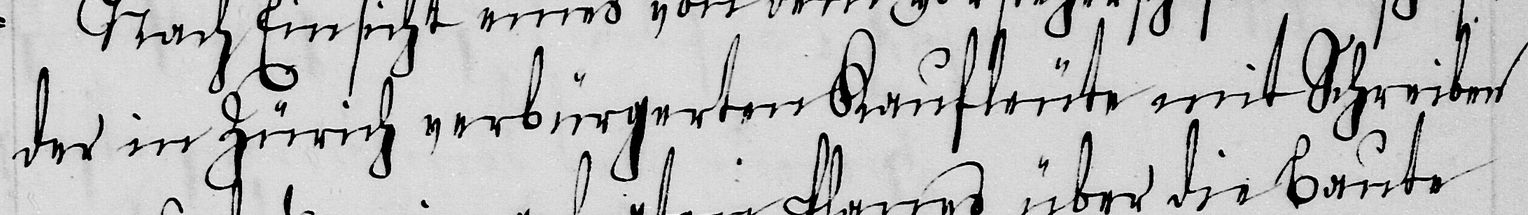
der in Zürich verbürgerten Kaufleute mit Schreiben
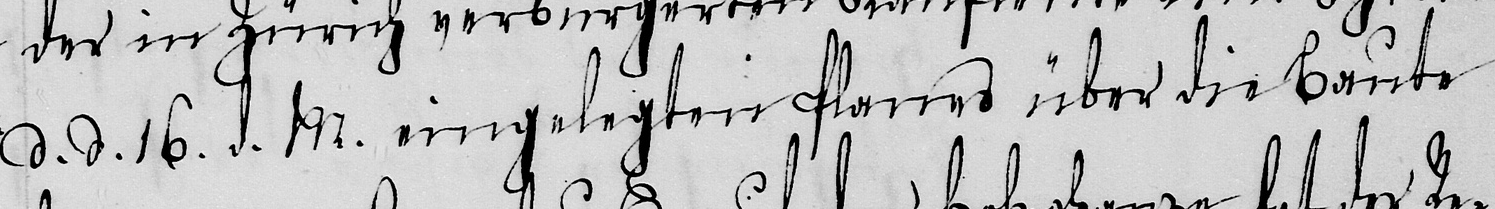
d. d. 16. d. M. eingelegten Planes über die Baute
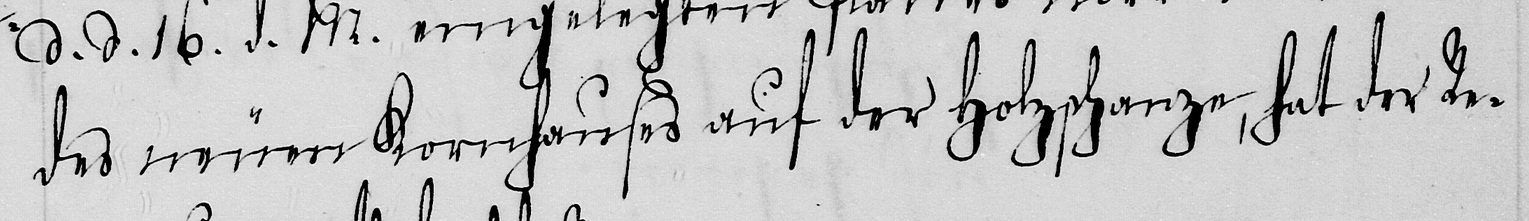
des neuen Kornhauses auf der Holzschanze, hat der Re¬
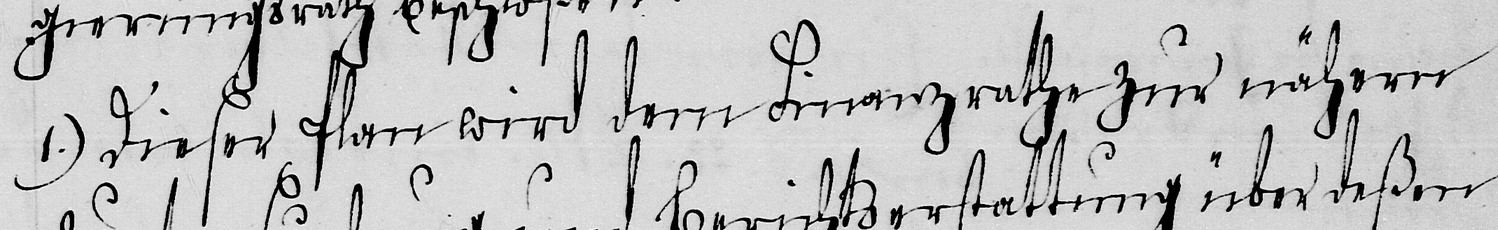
1.) Dieser Plan wird dem Finanzrathe zur nähern
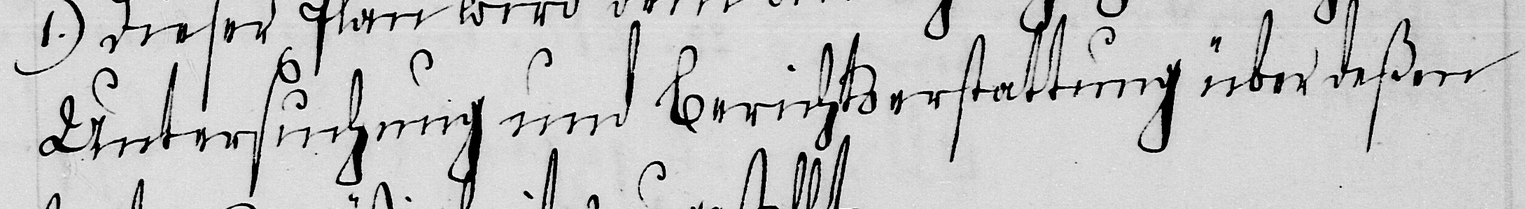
Untersuchung und Berichtserstattung über deßen
